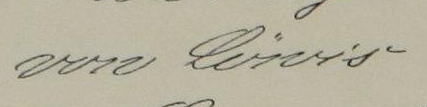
von Löwis
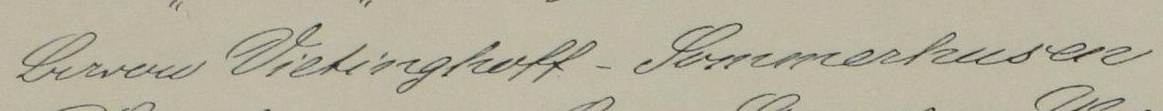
Baron Vietinghoff-Sommerhusen
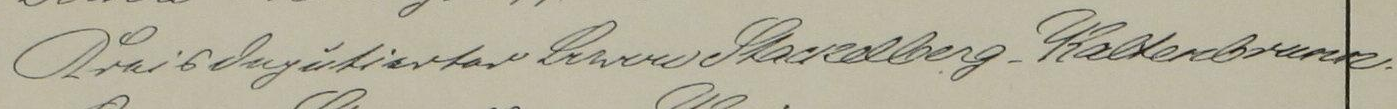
Kreisdeputierter Baron Stackelberg-Kaltenbrunn
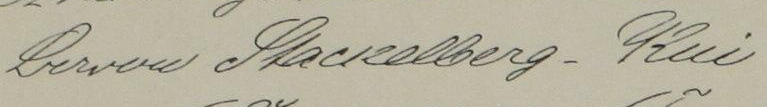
Baron Stackelberg-Kui
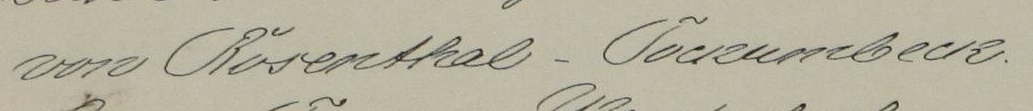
von Rosenthal-Tockumbeck
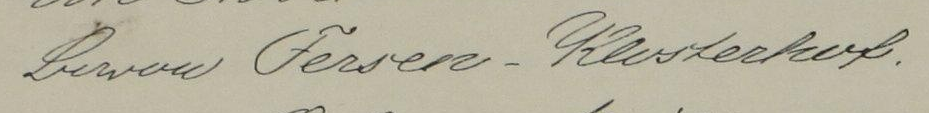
Baron Fersen-Klosterhof.
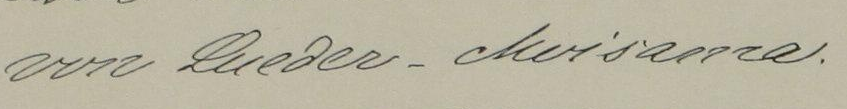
von Lueder-Moisama.
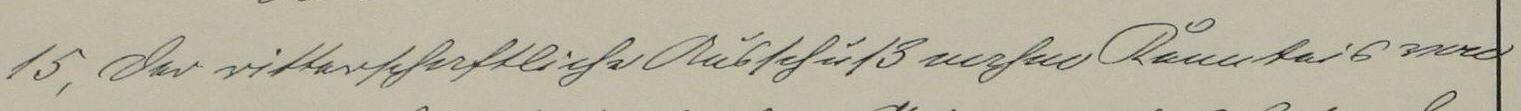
15. Der ritterschaftliche Ausschuß nahm Kenntnis von
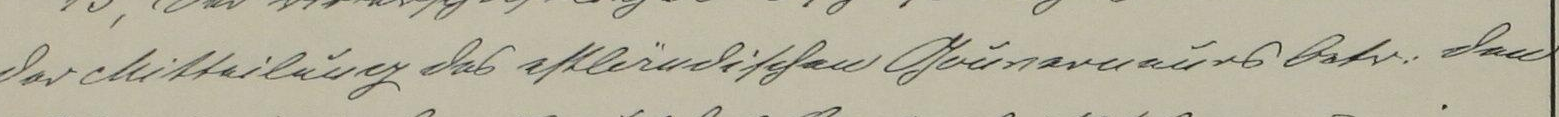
der Mitteilung des estländischen Gouverneurs betr. den
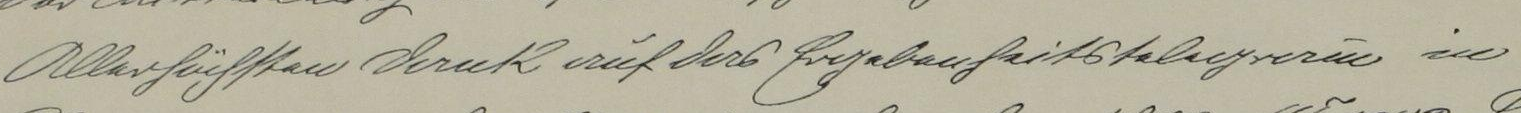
Allerhöchsten Dank auf das Ergebenheitstelegramm in
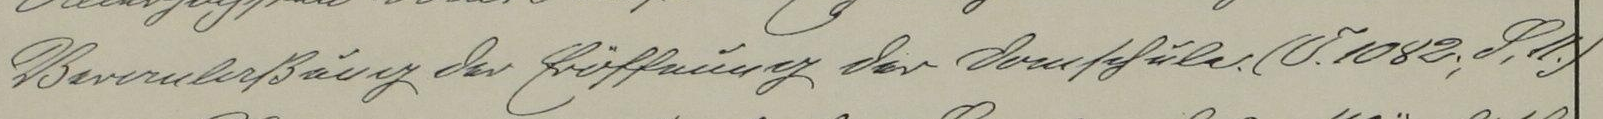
Veranlaßung der Eröffnung der Domschule (T.1082; S.11)
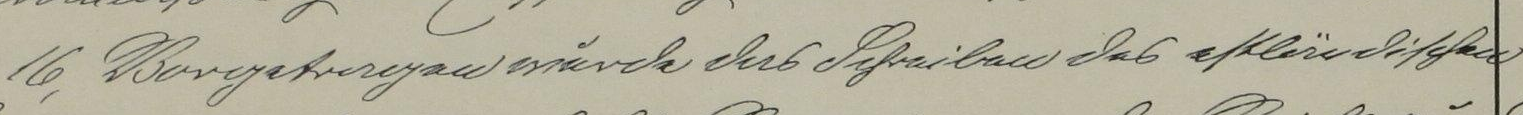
16. Vorgetragen wurde das Schreiben des estländischen
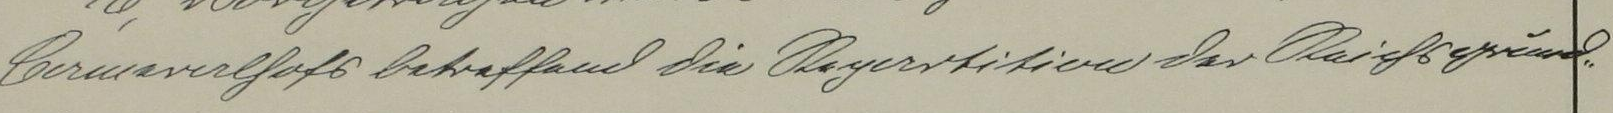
Cameralhofs betreffend die Repartition der Reichsgrund-
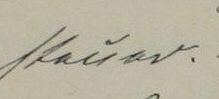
steuer.
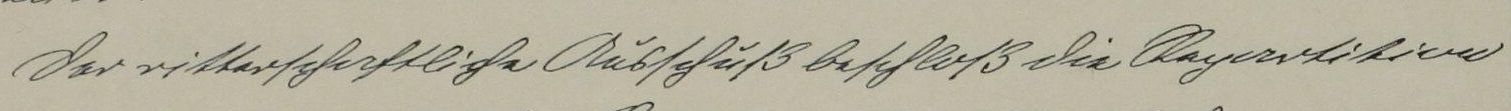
Der ritterschaftliche Ausschuß beschloß, die Repartition
